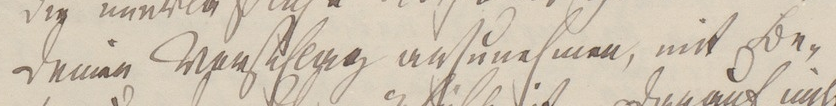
Deinen Vorschlag anzunehmen, mit Be-
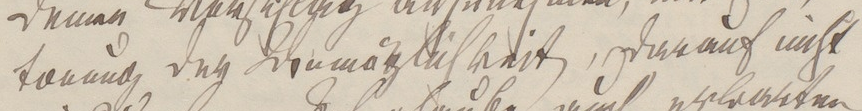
tonung der Unmöglichkeit, darauf nicht
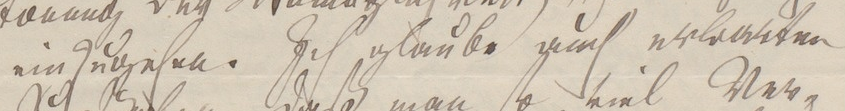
einzugehen. Ich glaube auch erwarten
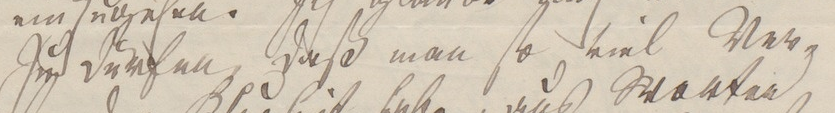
zu dürfen, daß man so viel Ver-
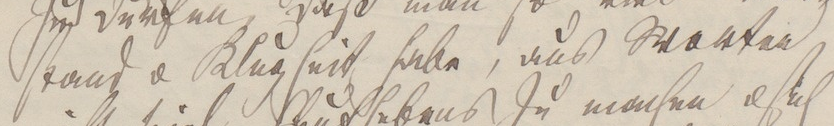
stand & Klugheit habe, aus Worten
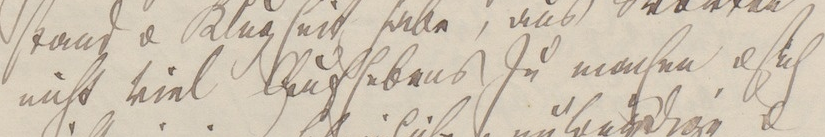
nicht viel Aufhebens zu mach & sich
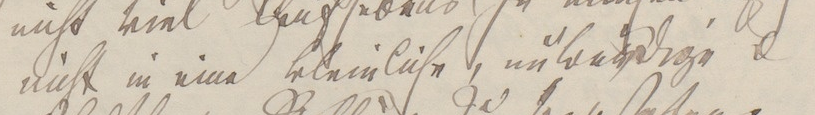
nicht in eine kleinliche, unwürdige &
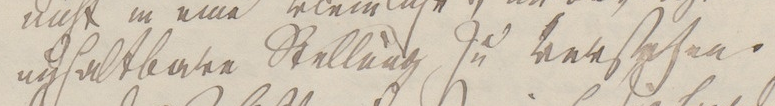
unhaltbare Stellung zu versezen.
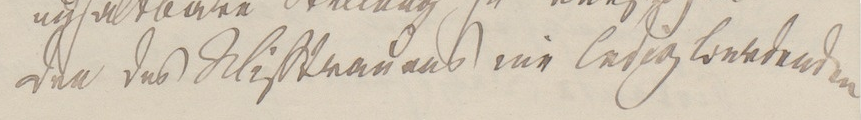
Den des Misstrauens nie ledig werdenden
